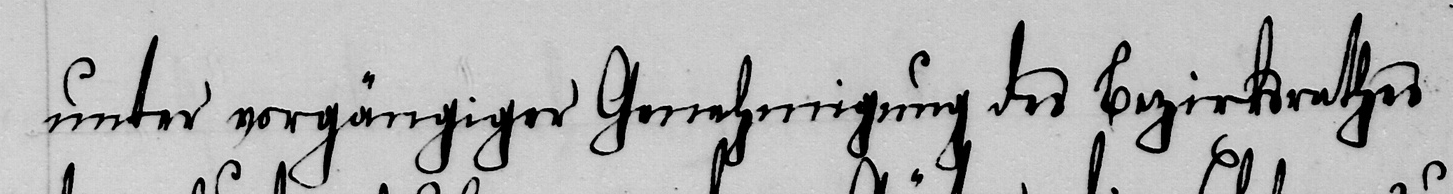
unter vorgängiger Genehmigung des Bezirksrathes
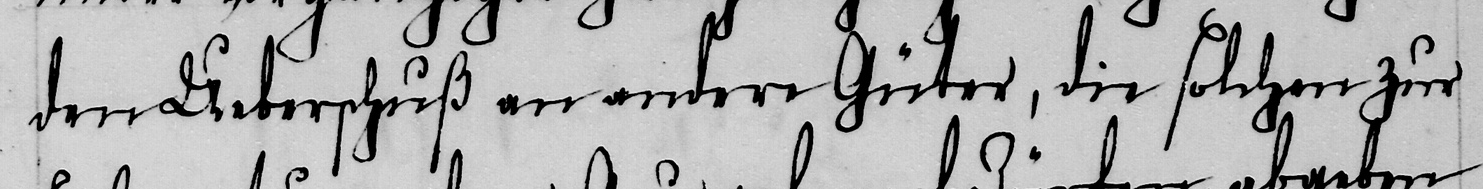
den Ueberschuß an andere Güter, die solchen zur
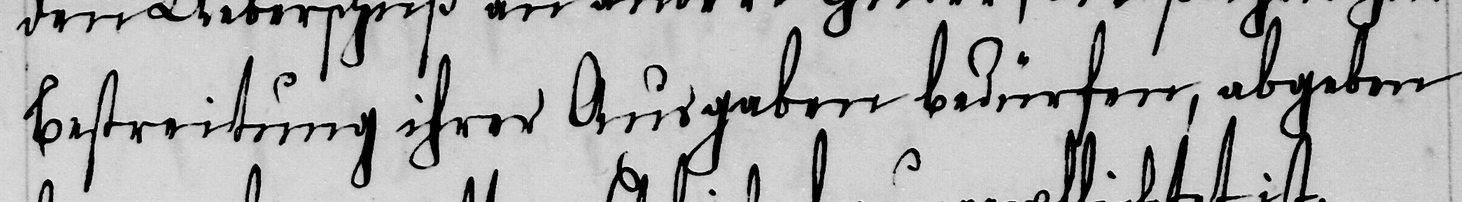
Bestreitung ihrer Ausgaben bedürfen, abgeben
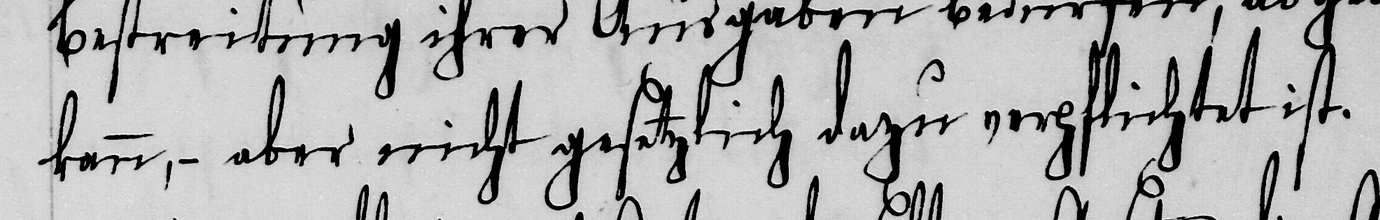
kann, – aber nicht gesetzlich dazu verpflichtet ist.
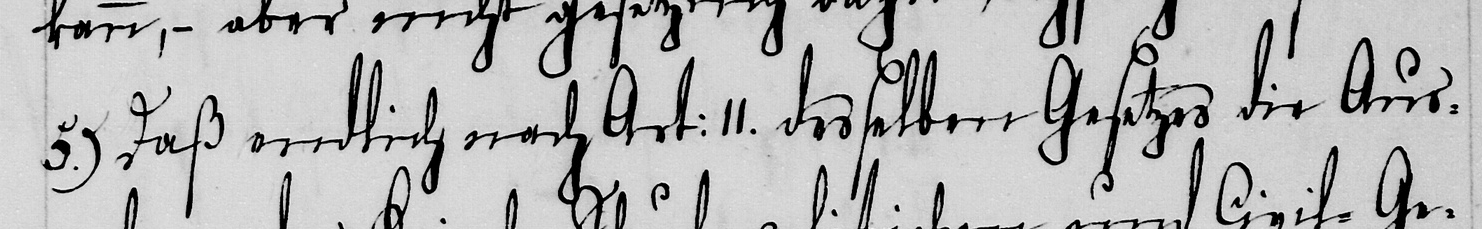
5.) Daß endlich nach Art: 11. desselben Gesetzes die Aus¬
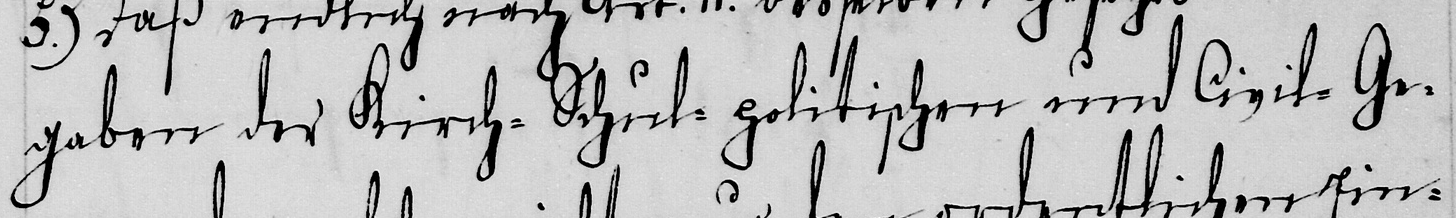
gaben der Kirch- Schul- politischen und Civil-Ge¬
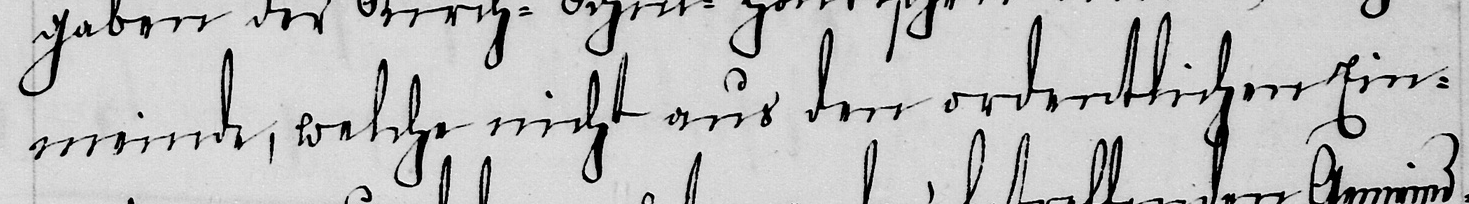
meinde, welche nicht aus den ordentlichen Ein¬
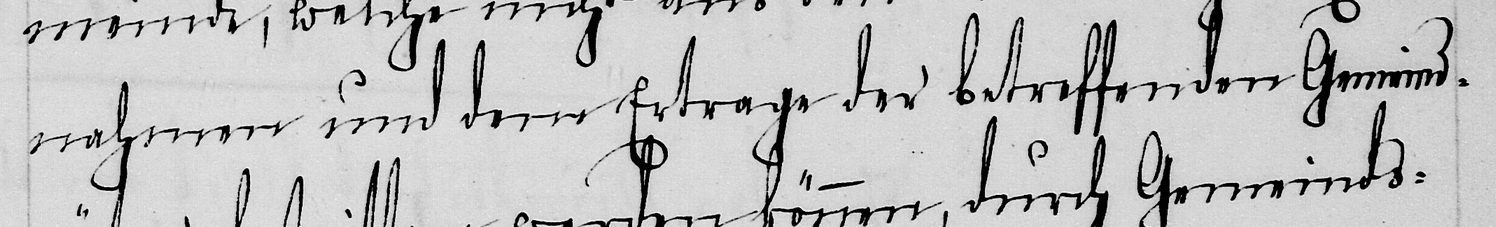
nahmen und dem Ertrage der betreffenden Gemeind¬
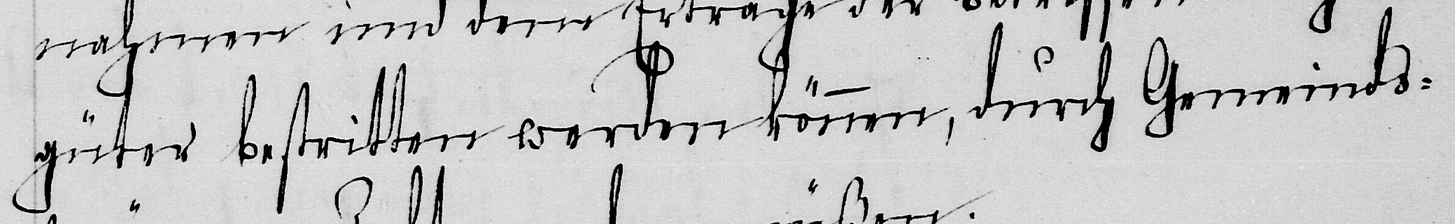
güter bestritten werden können, durch Gemeinds¬
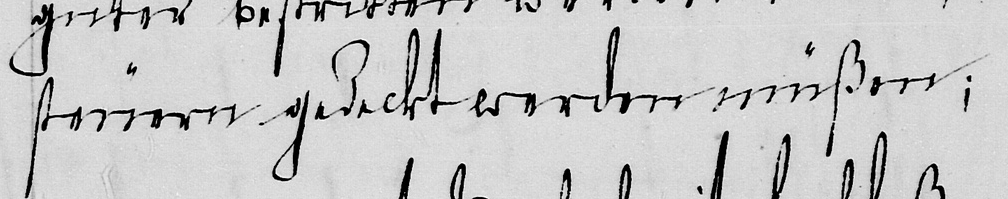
steuern gedeckt werden müßen;
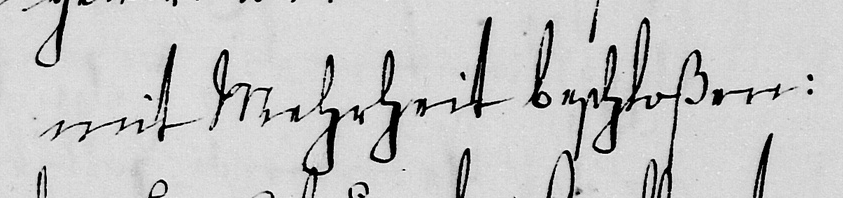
mit Mehrheit beschloßen:
